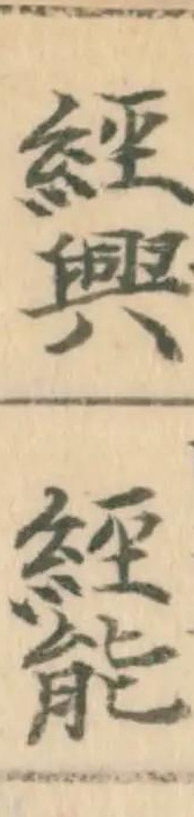経興経能
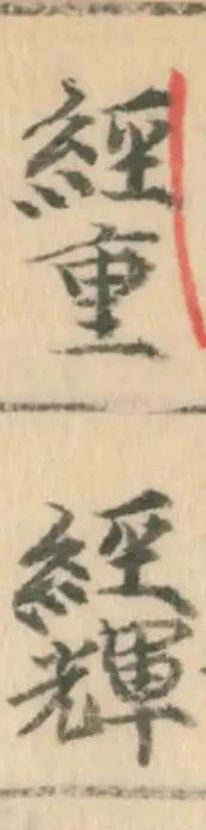経重経輝

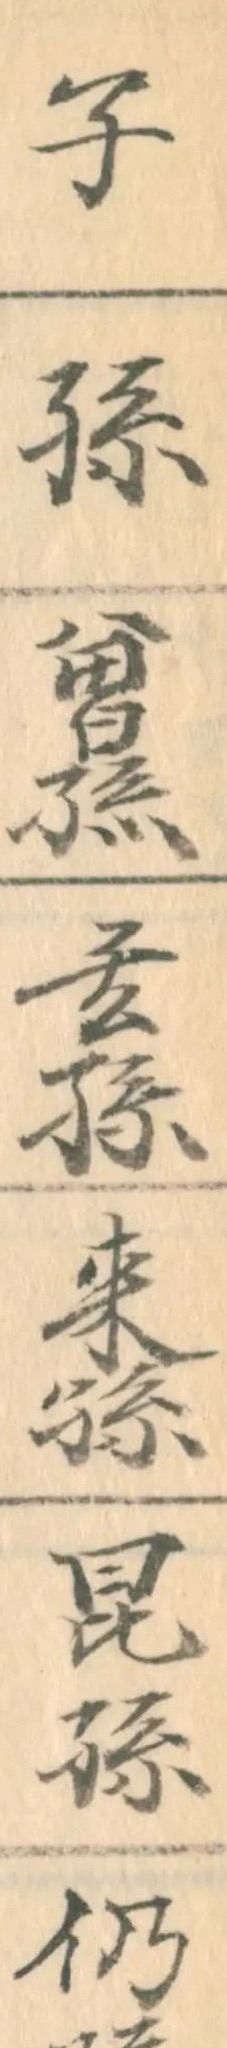子孫曽孫玄孫来孫昆孫仍孫
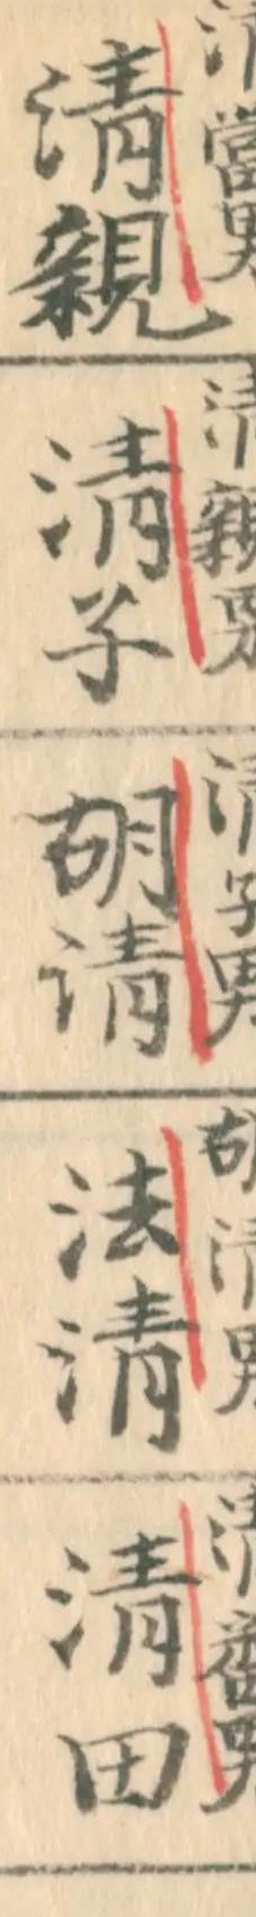清親清子胡清法清清田
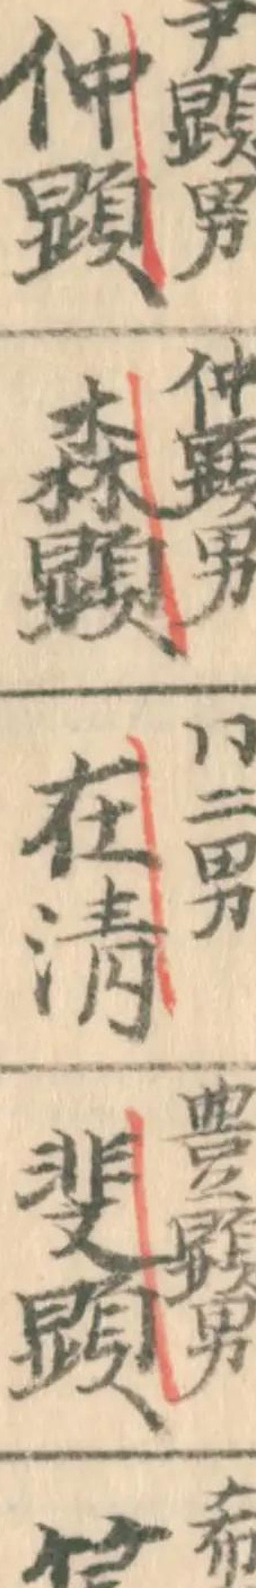仲顕森顕在清斐顕等顕
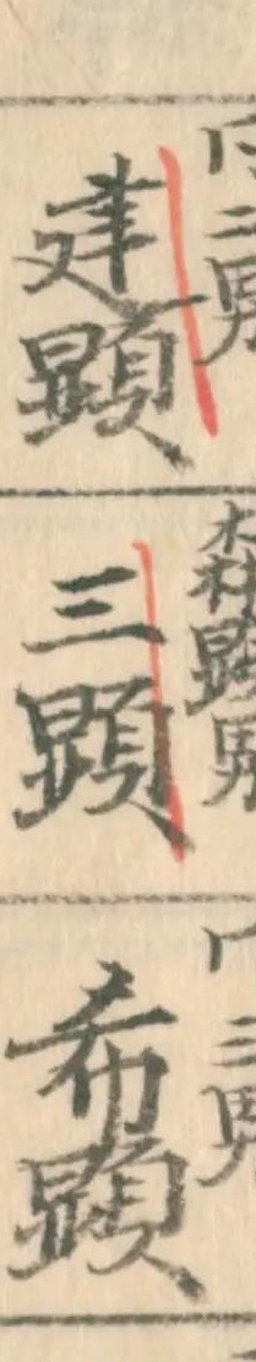建顕三顕希顕

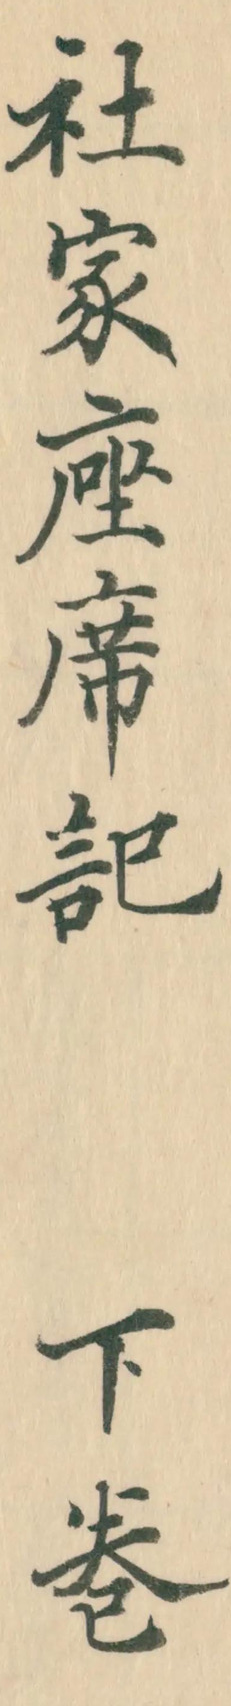社家座席記下巻

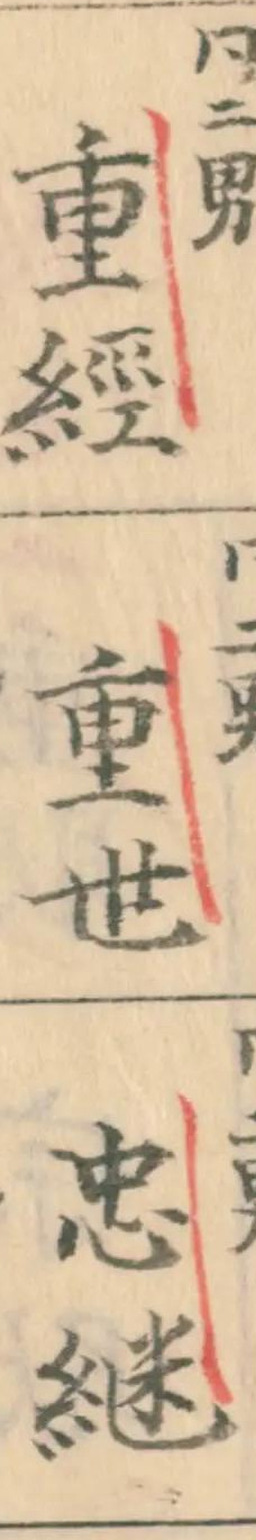重経重世忠継
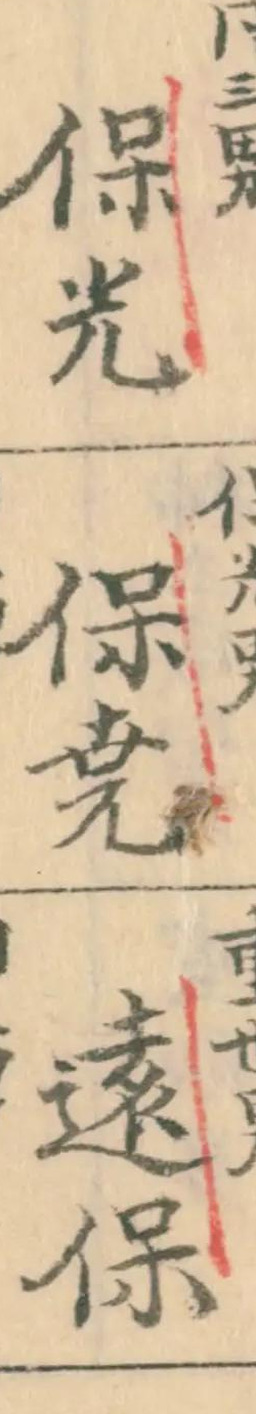保光保尭遠保
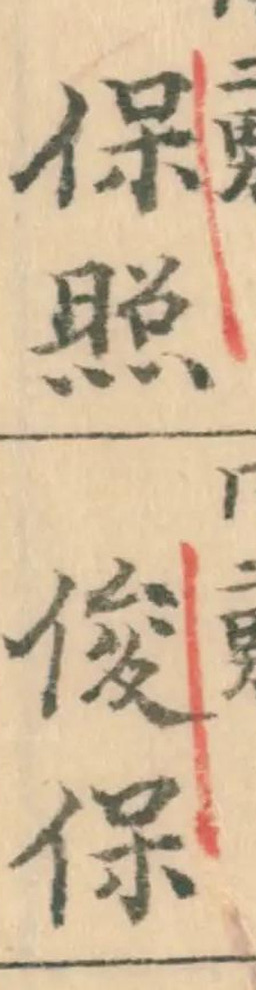保照俊保

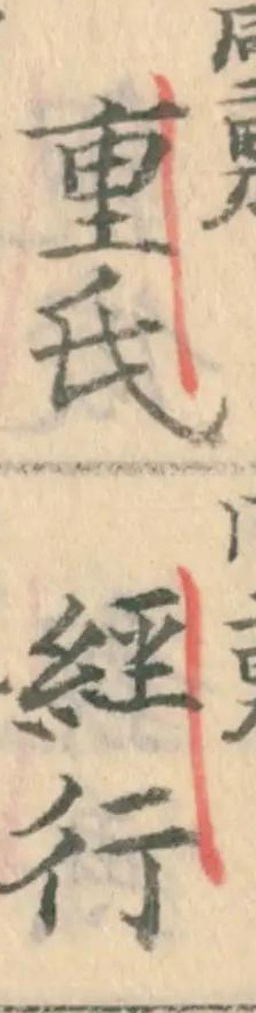重氏経行
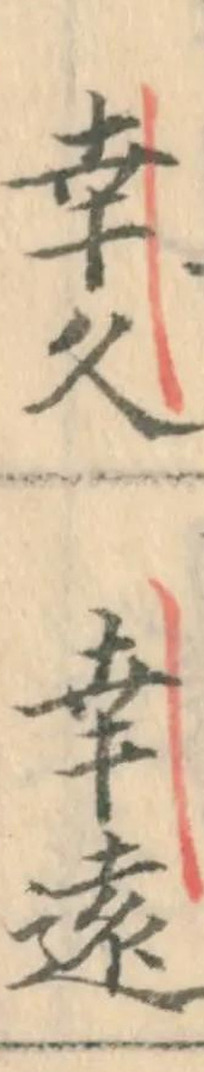幸久幸遠
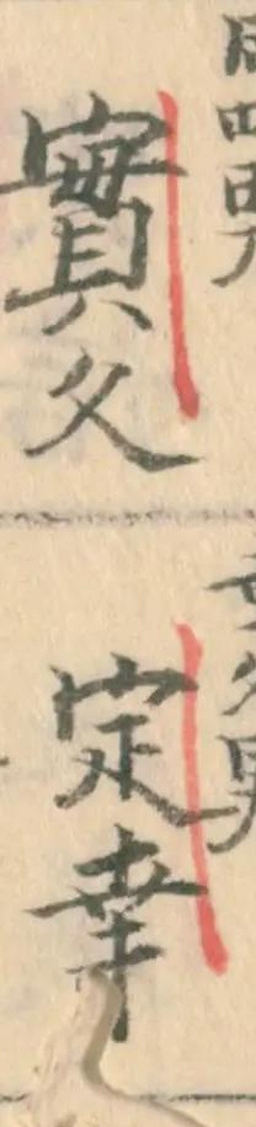實久定幸
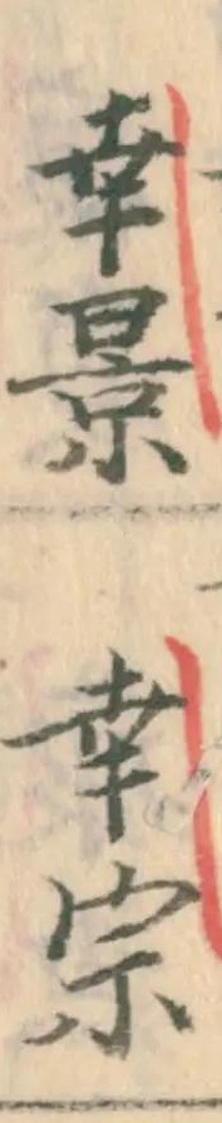幸景幸宗

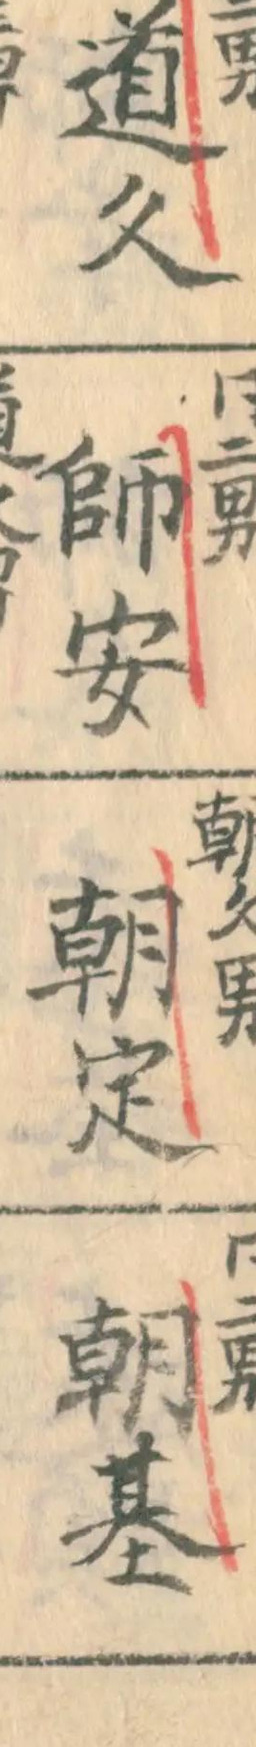道久師安朝定朝基
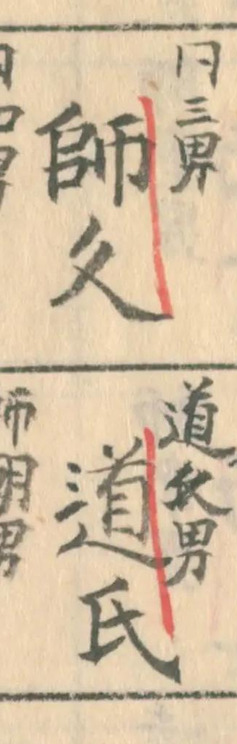師久道氏
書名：賀茂社記録. 第24冊
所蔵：国立国会図書館 National Diet Library, JAPAN
